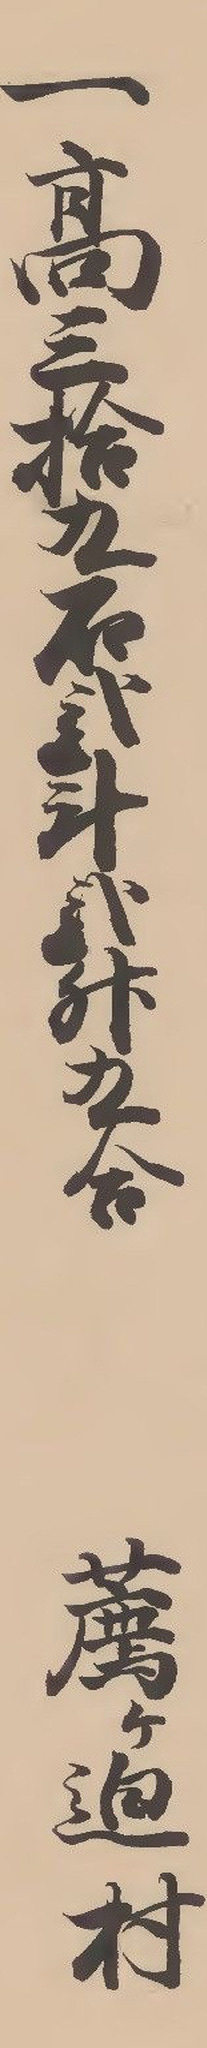一高三拾九石弐斗弐升九合薦ヶ迫村
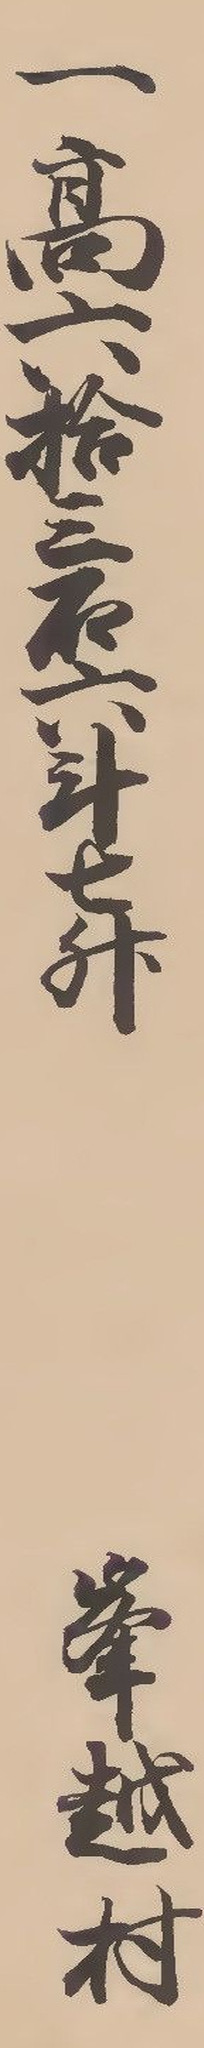一高六拾三石六斗七升峰越村

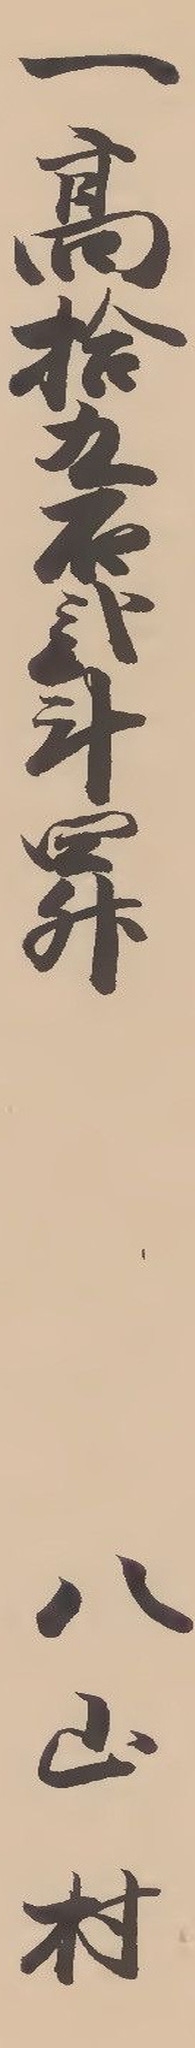一高拾九石弐斗四升八山村
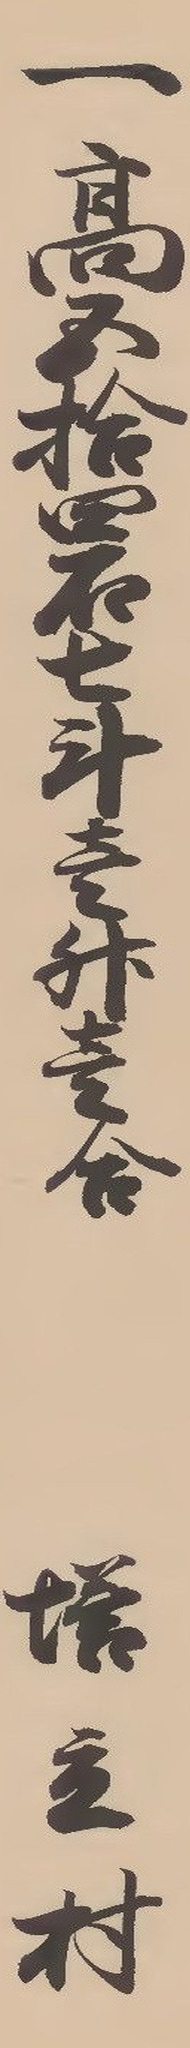一高五拾四石七斗壱升壱合塔立村
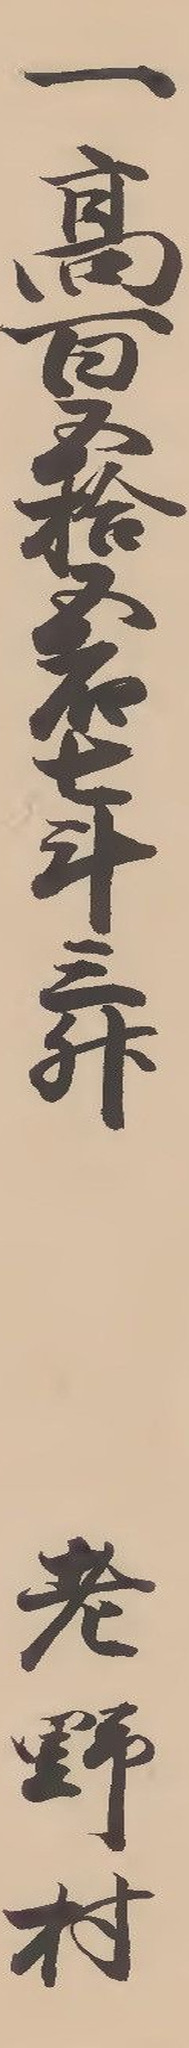一高百五拾五石七斗三升老野村
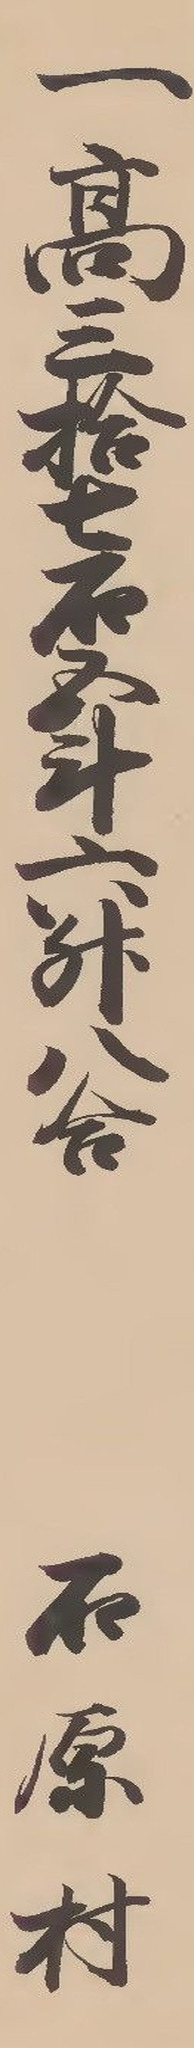一高三拾七石五斗六升八合石原村
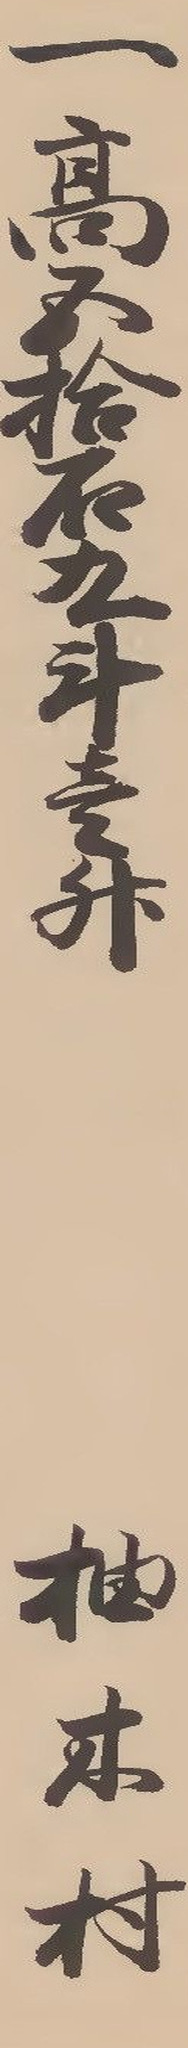一高五拾石九斗壱升柚木村
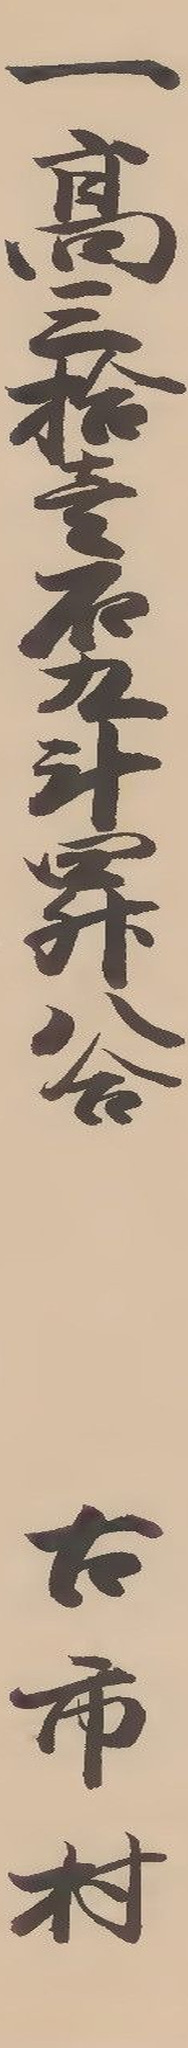一高三拾壱石九斗四升八合古市村
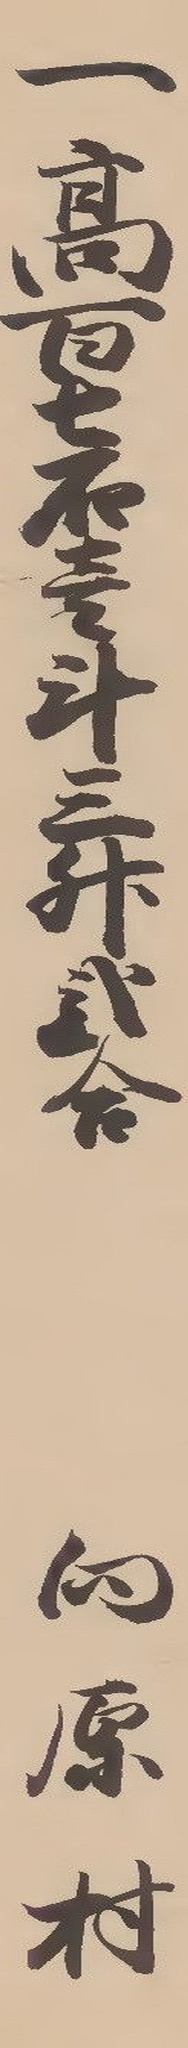一高百七石壱斗三升弐合向原村
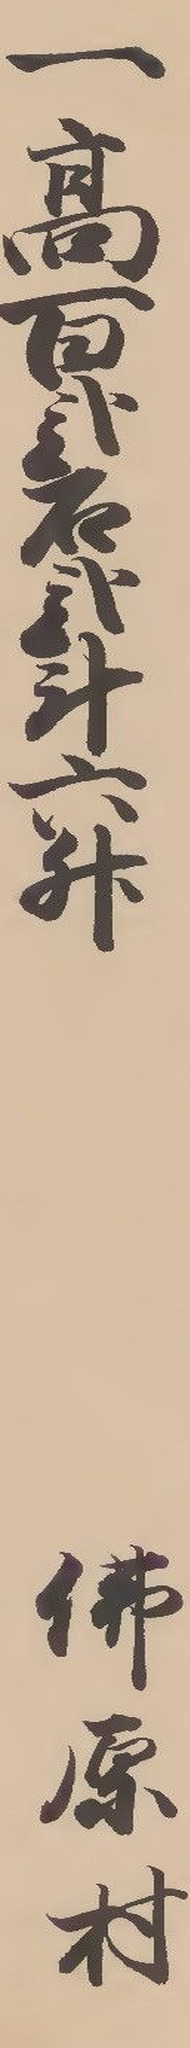一高百弐石弐斗六升仏原村

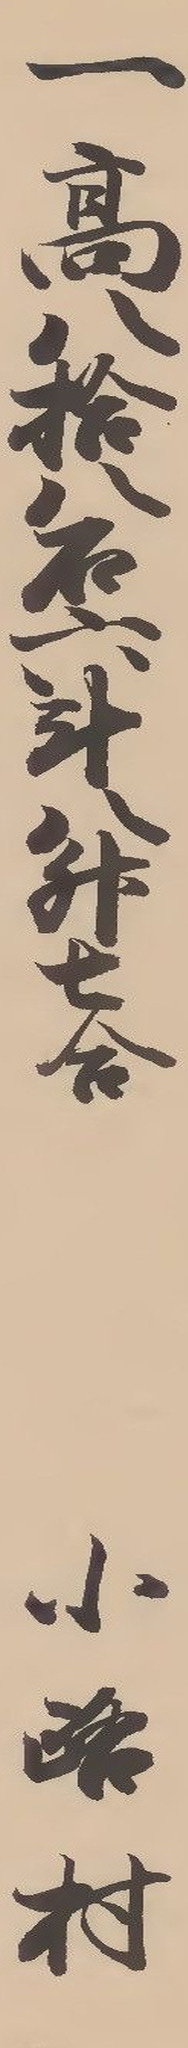一高八拾八石六斗八升七合小路村
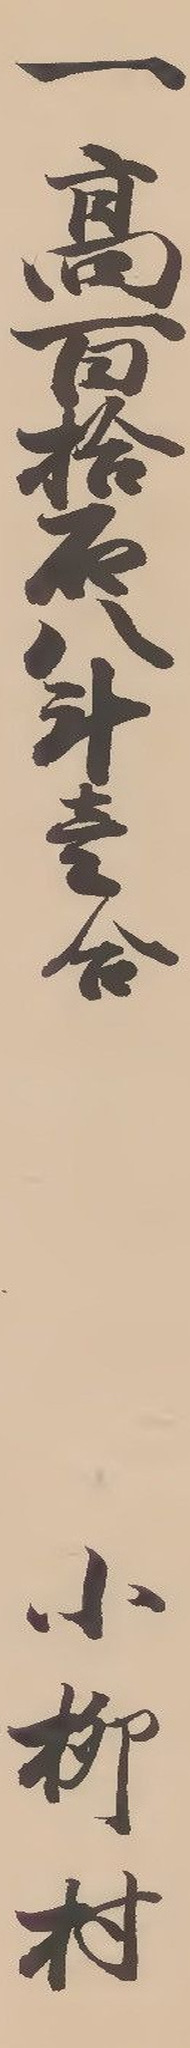一高百拾石八斗壱合小柳村
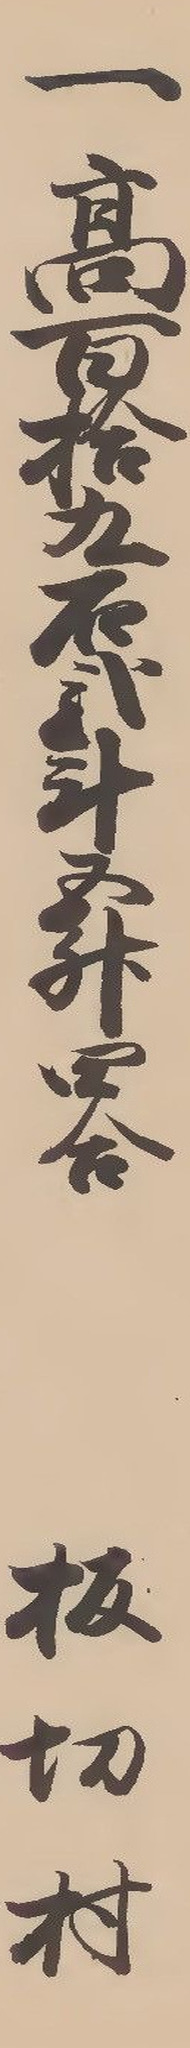一高百拾九石弐斗五升四合板切村
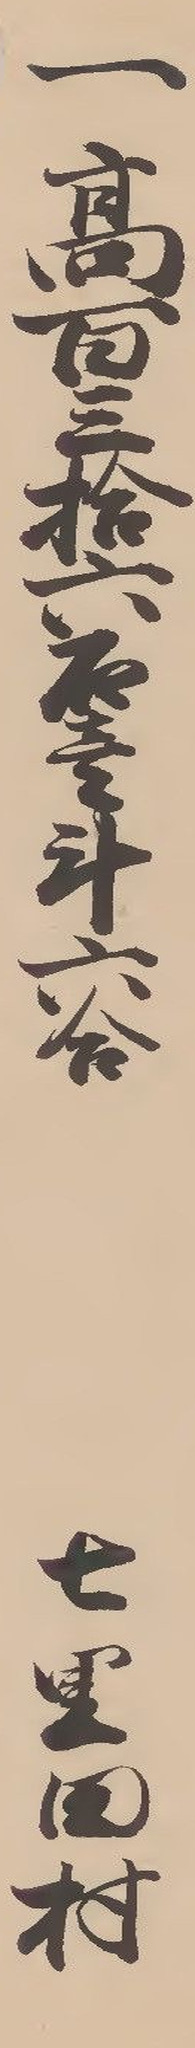一高百三拾六石壱斗六合七里田村
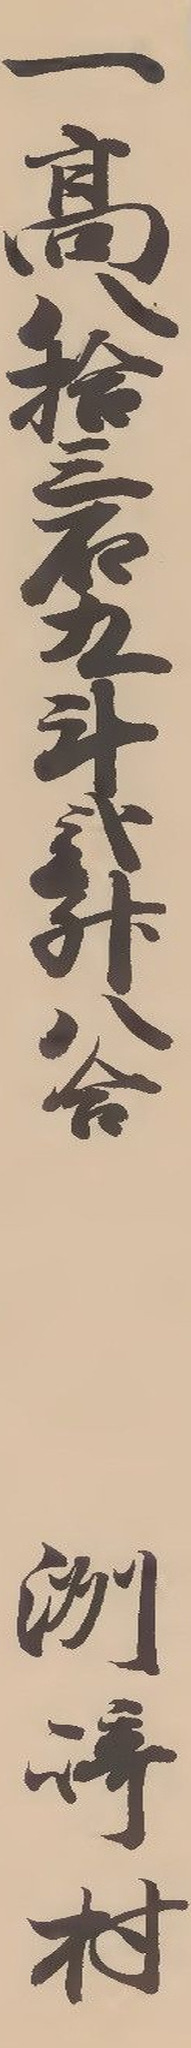一高八拾三石九斗弐升八合洲崎村
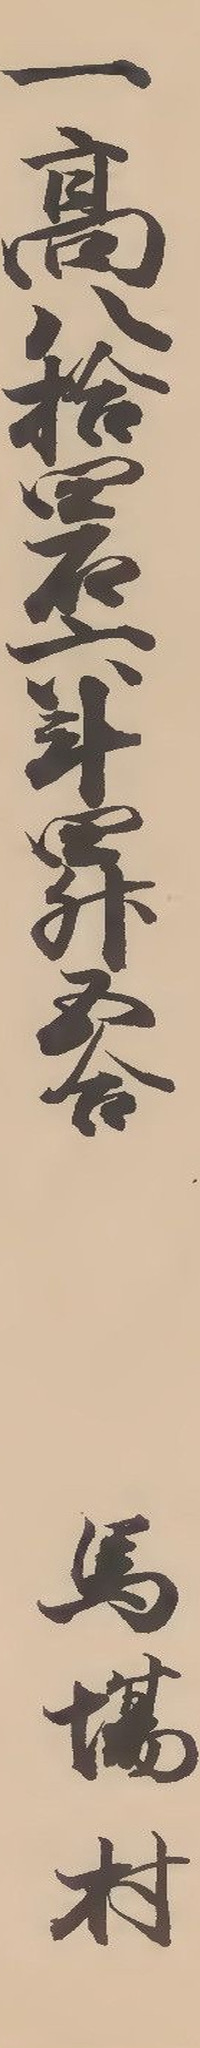一高八拾四石六斗四升五合馬場村
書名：豊後国郷帳
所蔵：国立公文書館 National Archives of Japan
